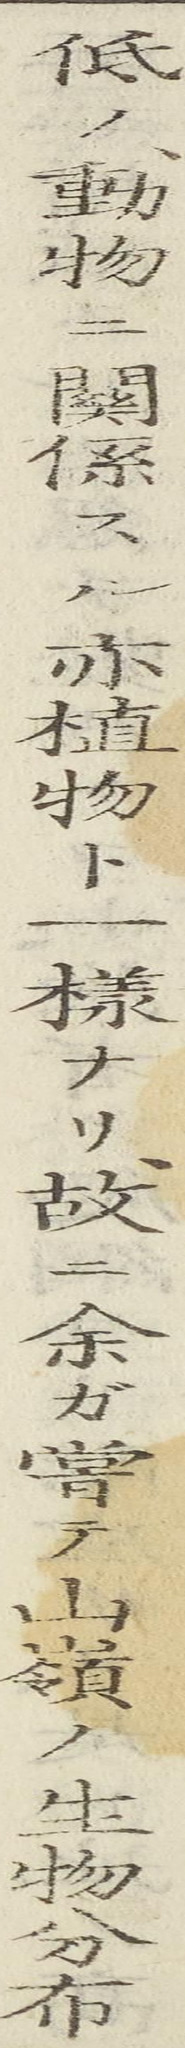低ノ、動物ニ関係スル亦植物ト一様ナリ、故ニ余ガ甞テ山嶺ノ生物分布
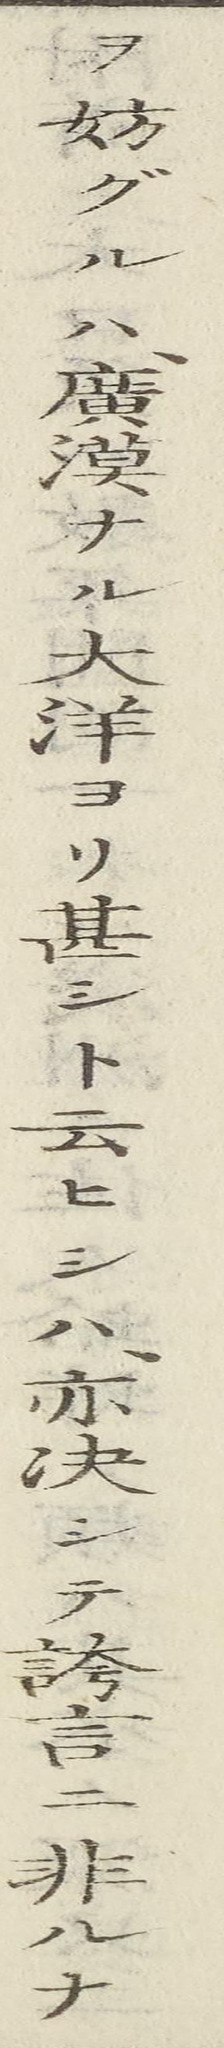ヲ妨グルハ、広漠ナル大洋ヨリ甚シト云ヒシハ、亦決シテ誇言ニ非ルナ
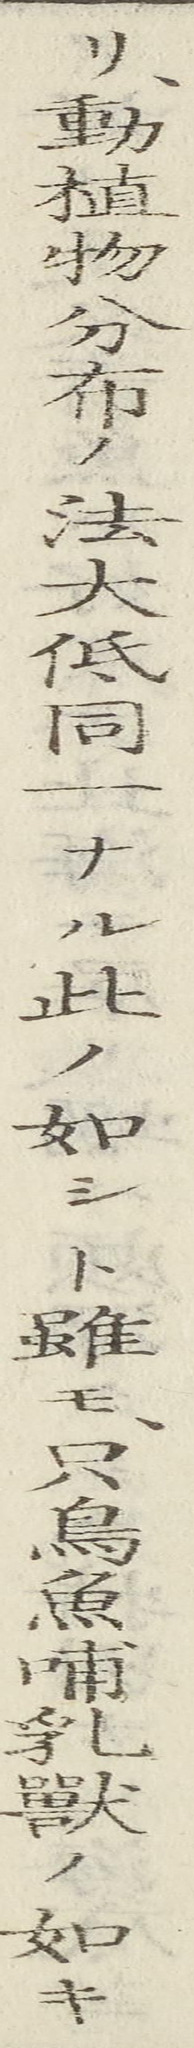リ、動植物分布ノ法大抵同一ナル此ノ如シト雖モ、只鳥魚哺乳獣ノ如キ
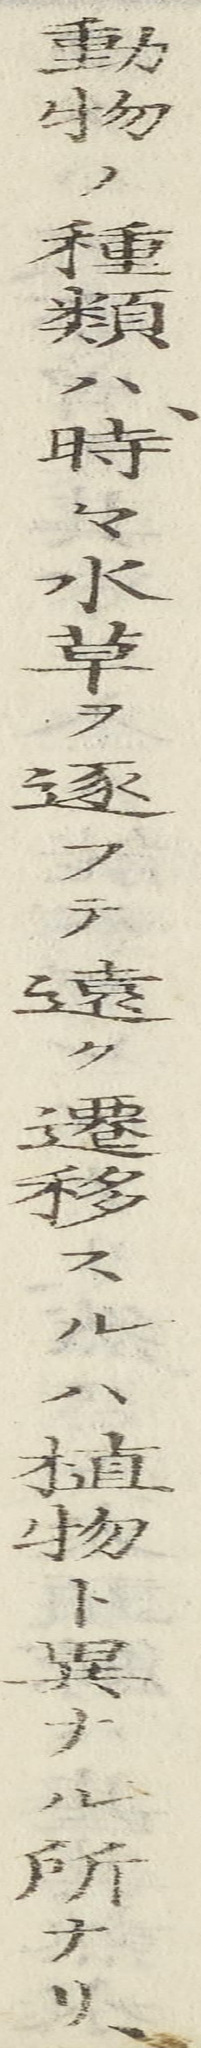動物ノ種類ハ、時々水草ヲ遂フテ遠ク遷移スルハ植物ト異ナル所ナリ、
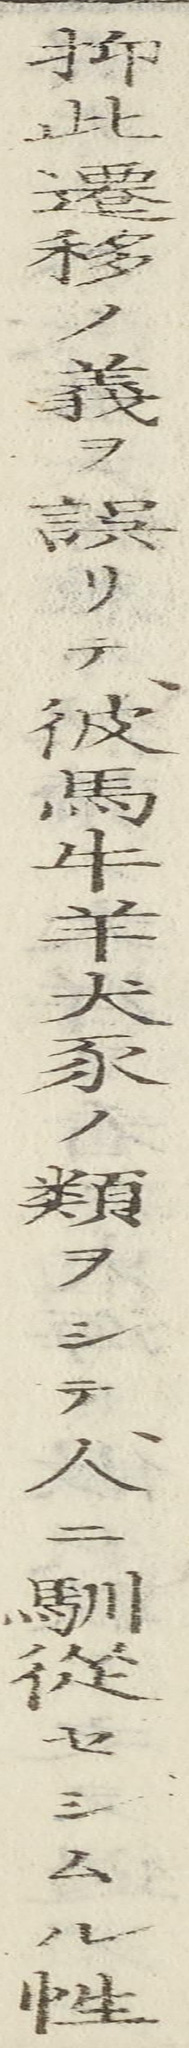抑此遷移ノ義ヲ誤リテ、彼馬牛羊犬豕ノ類ヲシテ、人ニ馴従セシムル性
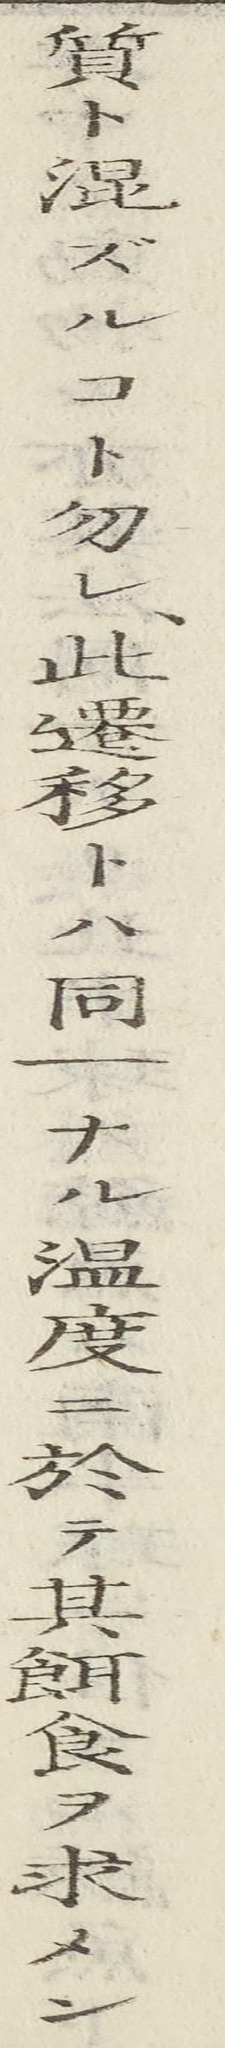質ト混ズルコト勿レ、此遷移トハ同一ナル温度ニ於テ其餌食ヲ求メン
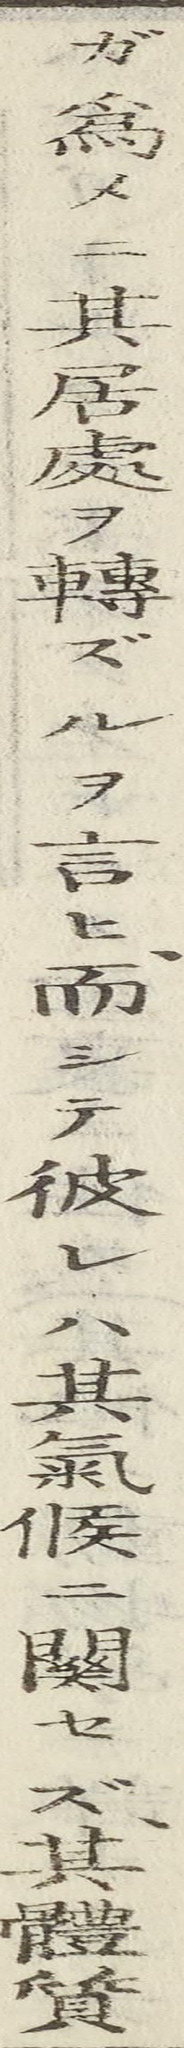ガ為メニ其居処ヲ転ズルヲ言ヒ、而シテ彼レハ其気候ニ関セズ、其体質
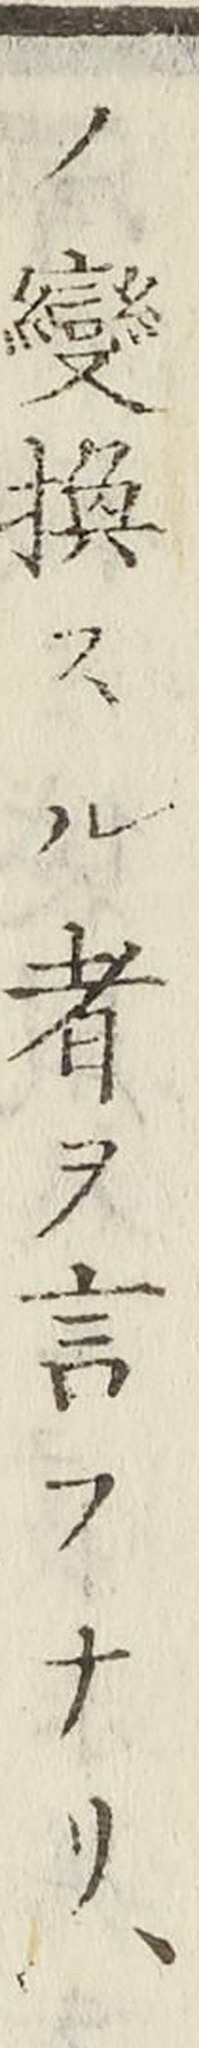ノ変換スル者ヲ言フナリ、
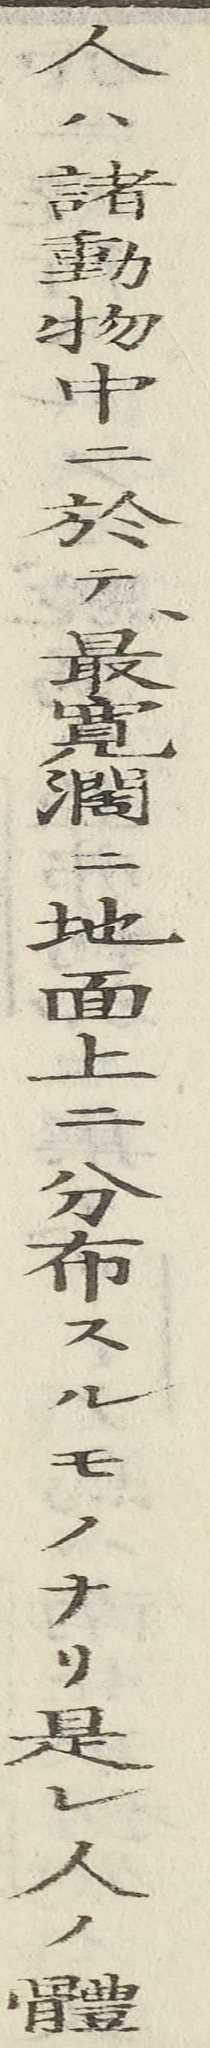人ハ諸動物中ニ於テ、最寛濶ニ地面上ニ分布スルモノナリ是レ人ノ体
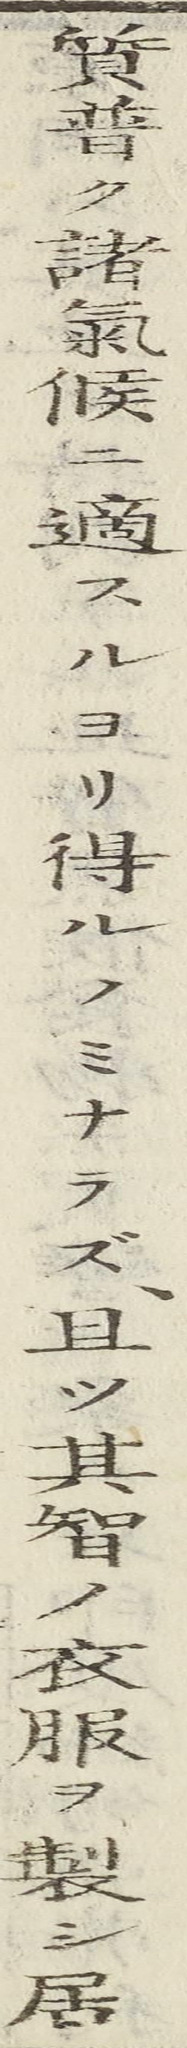質普ク諸気候ニ適スルヨリ得ルノミナラズ、且ツ其智ノ衣服ヲ製シ居
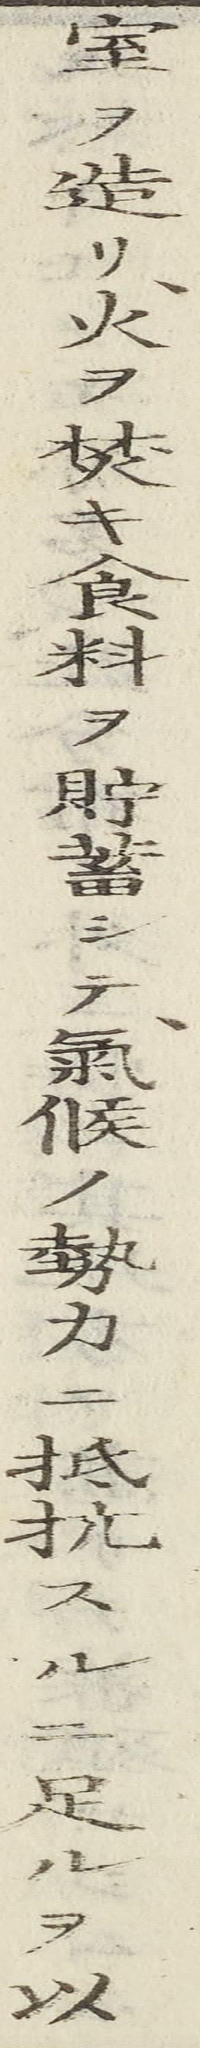室ヲ造リ、火ヲ焚キ食材ヲ貯蓄シテ、気候ノ勢力ニ抵抗スルニ足ルヲ以
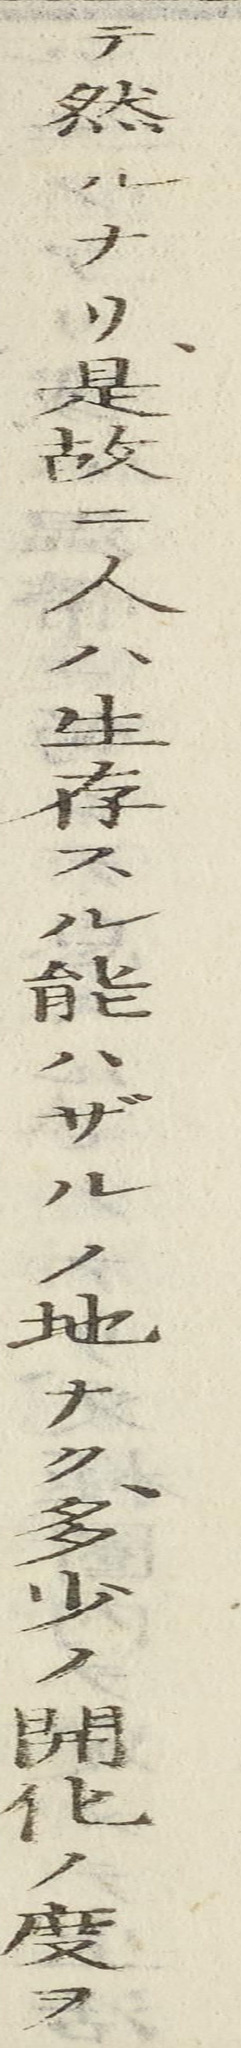テ然ルナリ、是故ニ人ハ生存スル能ハザルノ地ナク、多少ノ開化ノ度ヲ
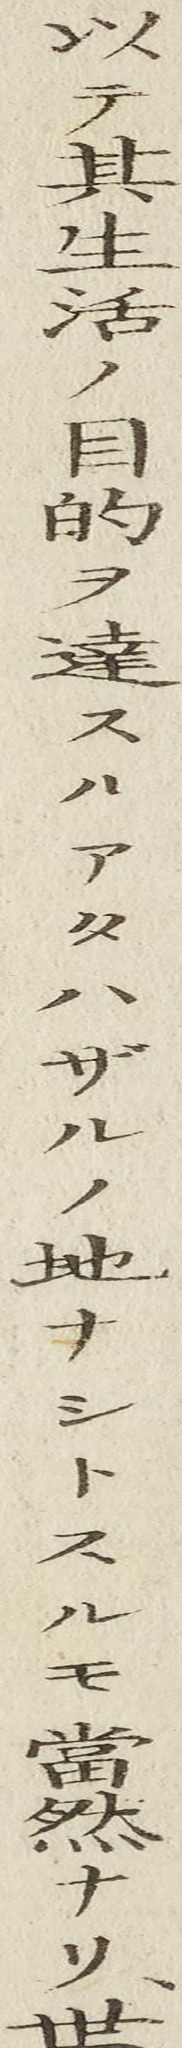以テ其生活ノ目的ヲ達スルアタハザルノ地ナシトスルモ当然ナリ、世
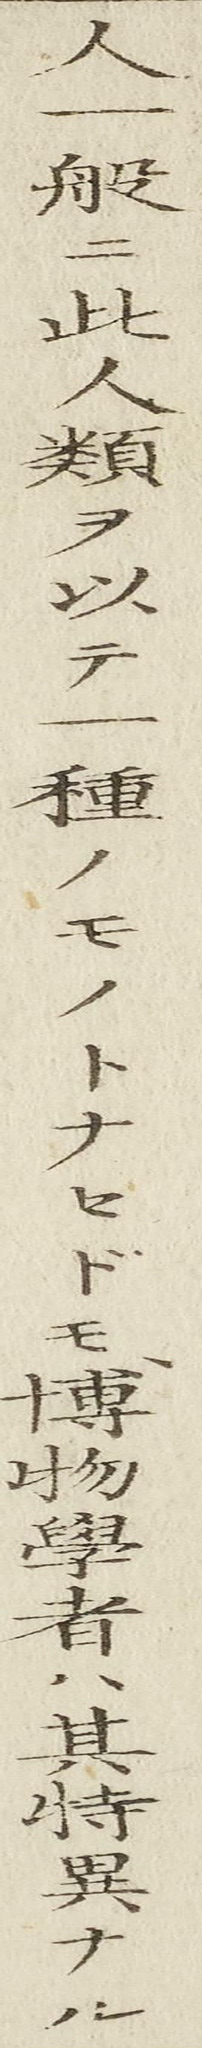人一般ニ此人類ヲ以テ一種ノモノトナセドモ、博物学者ハ其特異ナル
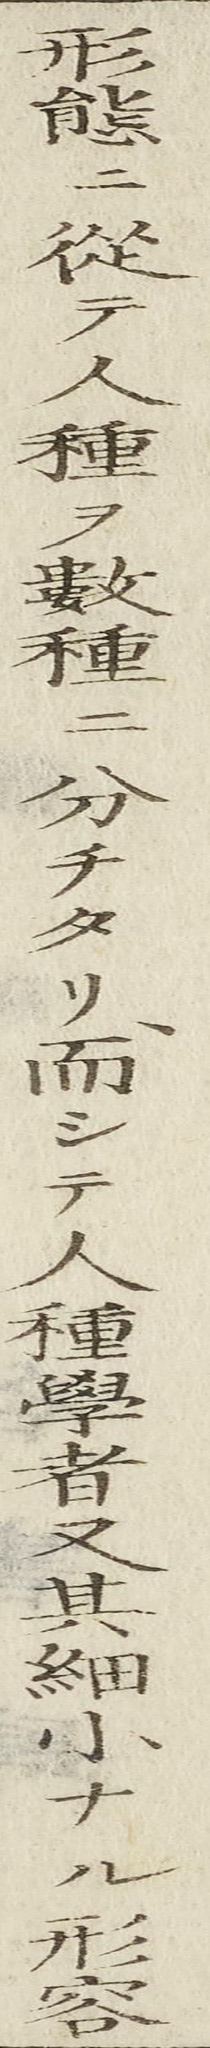形態ニ従テ人種ヲ数種ニ分チタリ、而シテ人種学者又其細小ナル形容
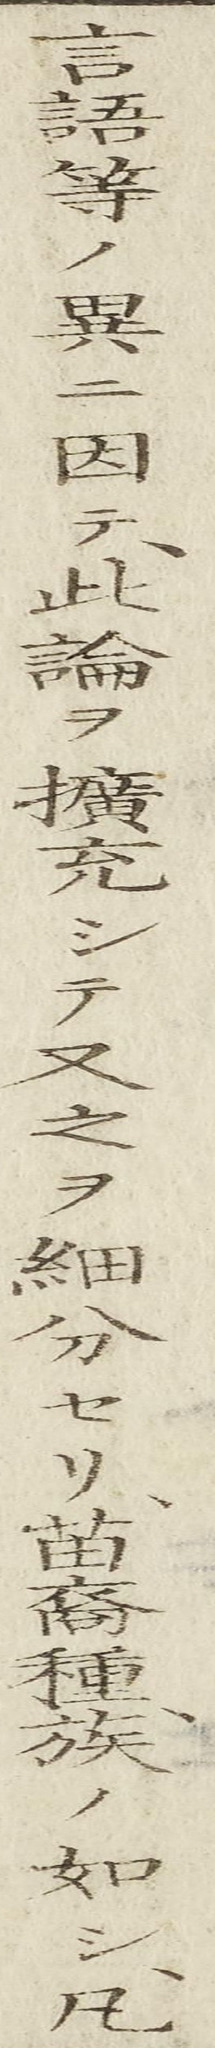言語等ノ異ニ因テ、此論ヲ拡充シテ又之ヲ細分セリ、苗裔種族ノ如シ、凡
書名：百科全書　地文學　全
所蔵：東京大学地震研究所図書室 Earthquake Research Institute Library, The University of Tokyo, JAPAN
